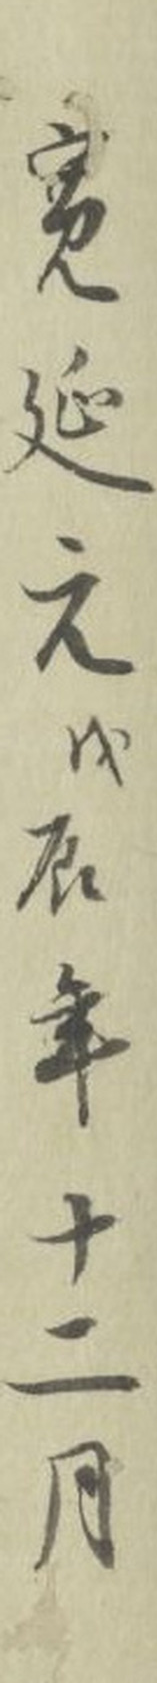寛延元戊辰年十二月
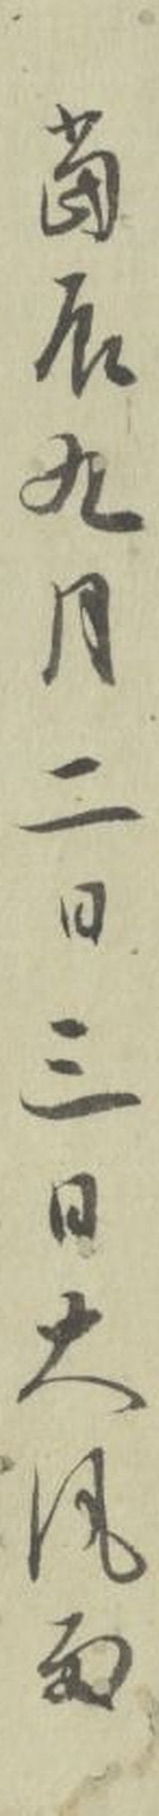当辰九月二日三日大風而
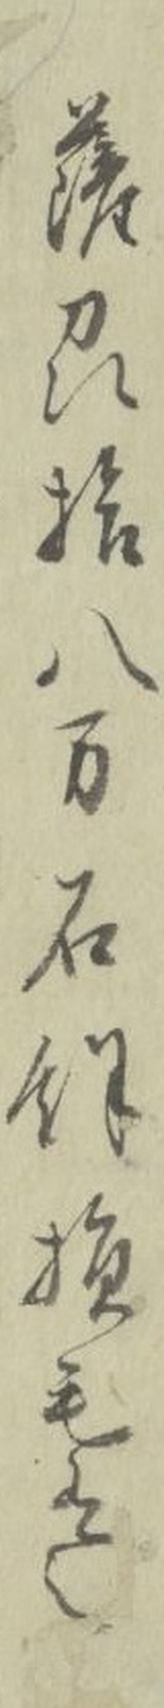薩州拾八万石余損毛有之
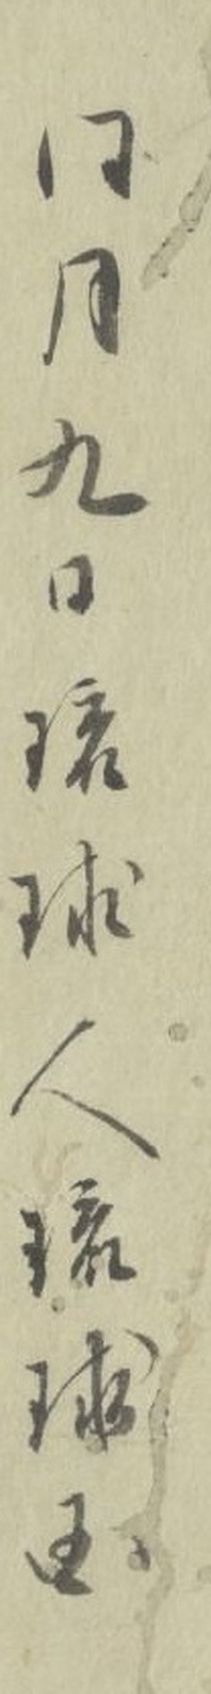同月九日琉球人琉球国

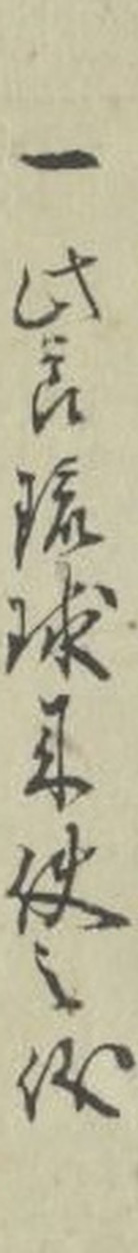一此節琉球来使之儀
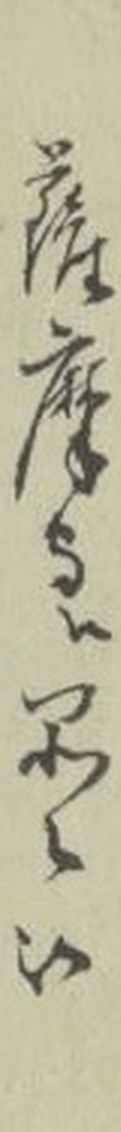薩摩守え品々被
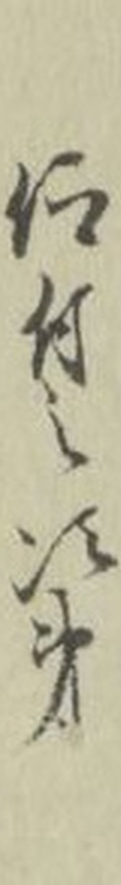仰付之次第
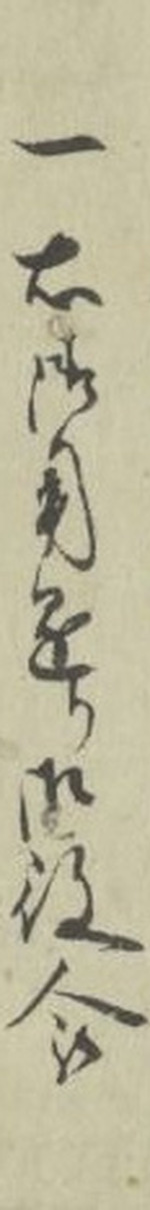一右御用懸り御役人被
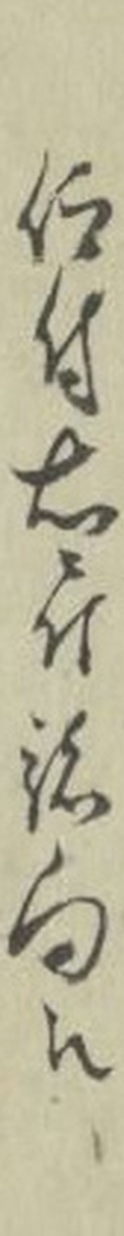仰付右に付諸向え
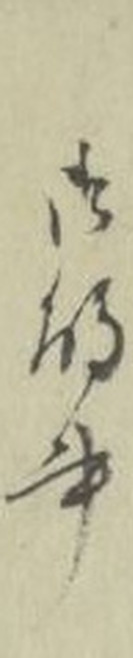御触書
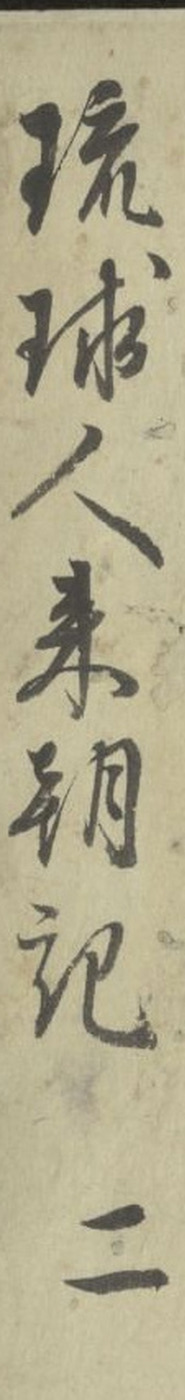琉球人来朝記二

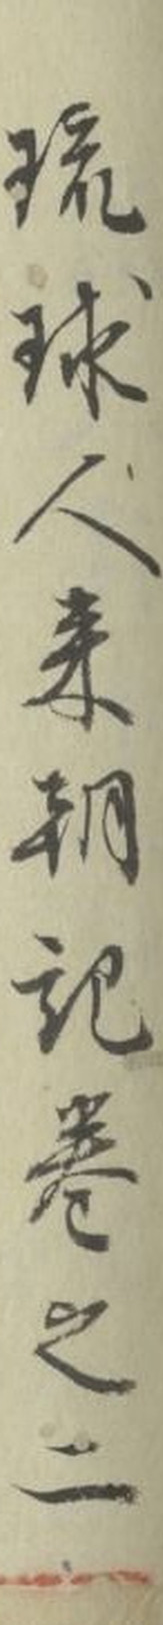琉球人来朝記巻之二
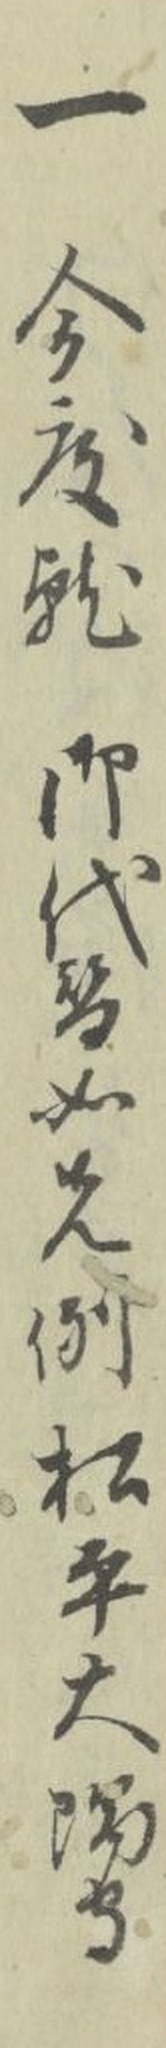一今度就御代替如先例松平大隅守
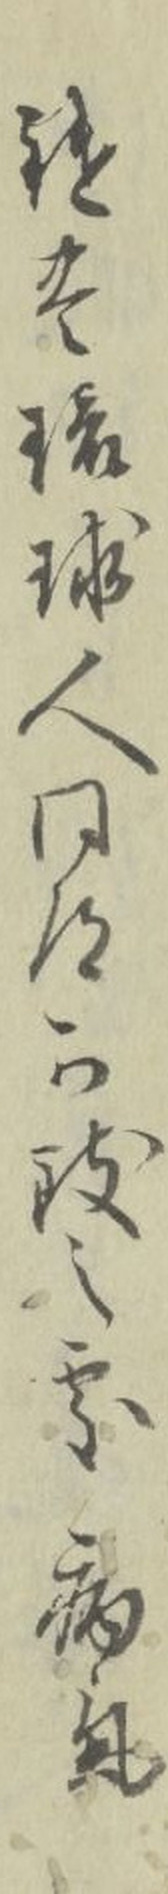継豊琉球人同道可致之処病気
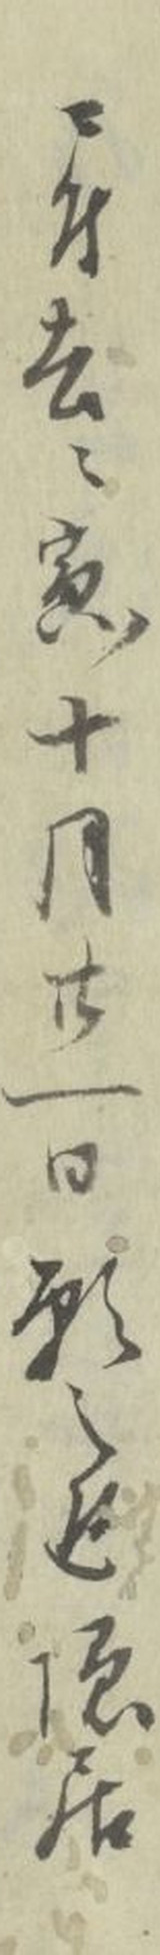に付去々寅の十月廿一日願之通隠居
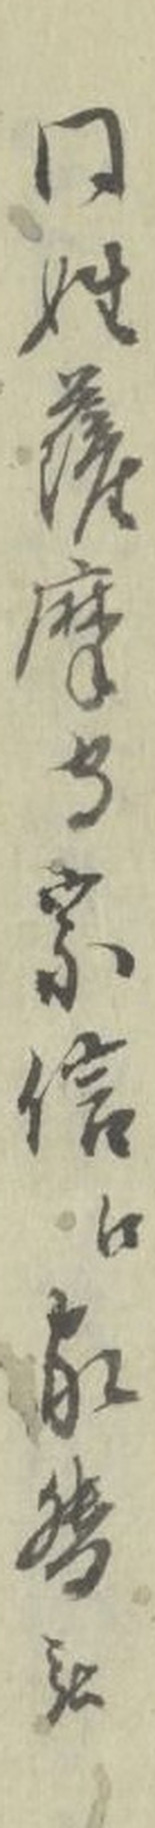同姓薩摩守宗信え家督被
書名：琉球来朝記 自一至七
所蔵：University of the Ryukyus Library
